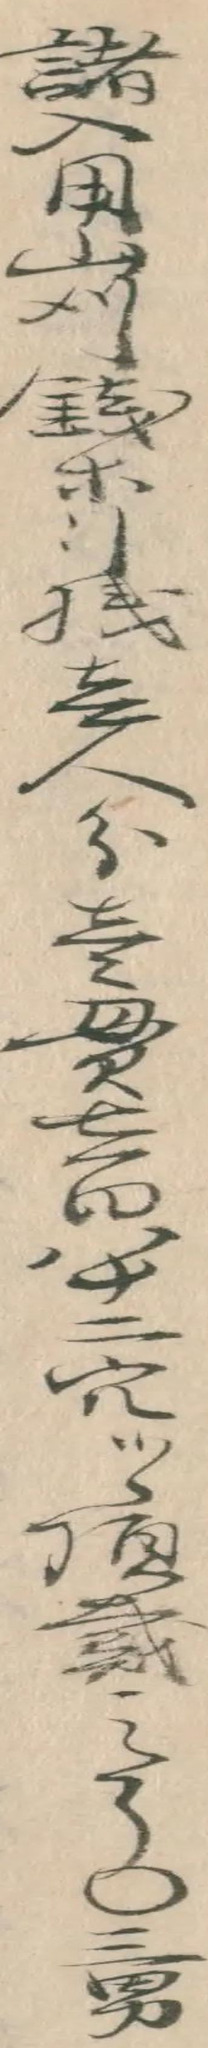諸入用山刈銭等引残壱人分壱貫七百八十二穴ツヽ頂戴之事○三男
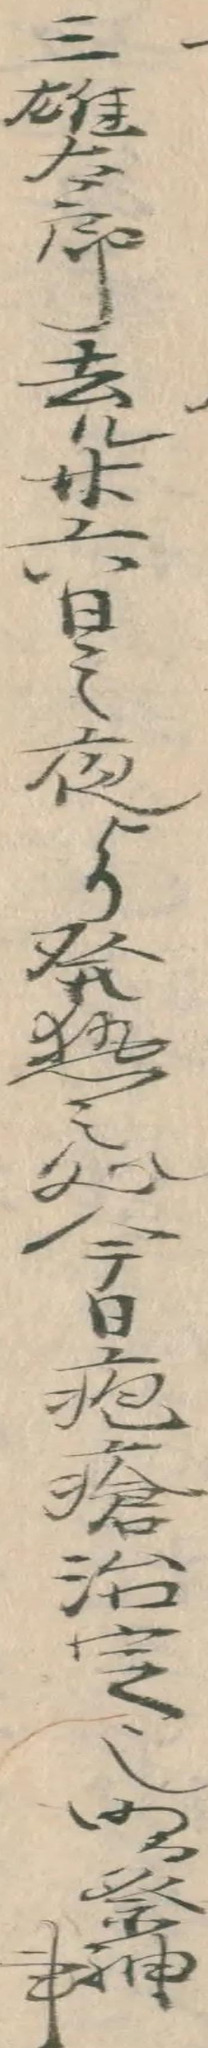三雄太郎去ル廿六日之夜より発熱之処今日疱瘡治定也仍而祭神事
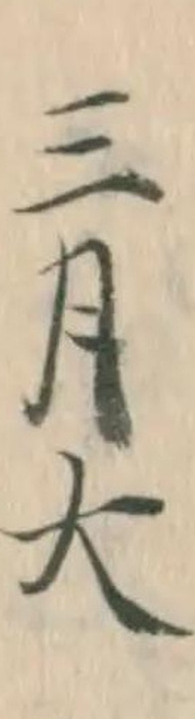三月大
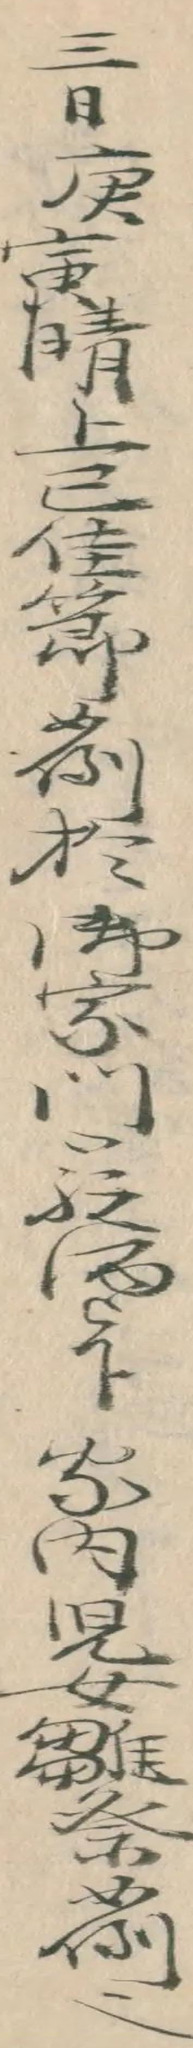三日庚寅晴上巳佳節如例於御家門御祝酒被下家内児女雛祭如例也
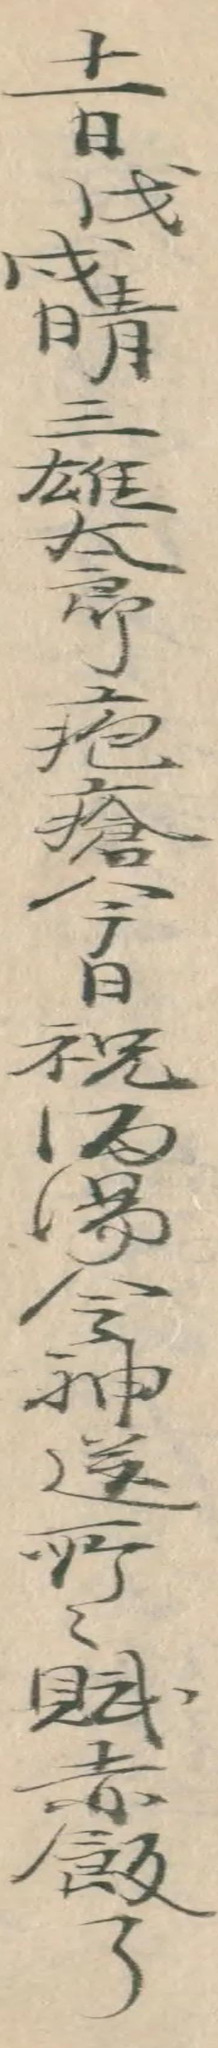十一日戊戌出晴三雄太郎疱瘡今日祝酒湯令神送所〻賦赤飯了
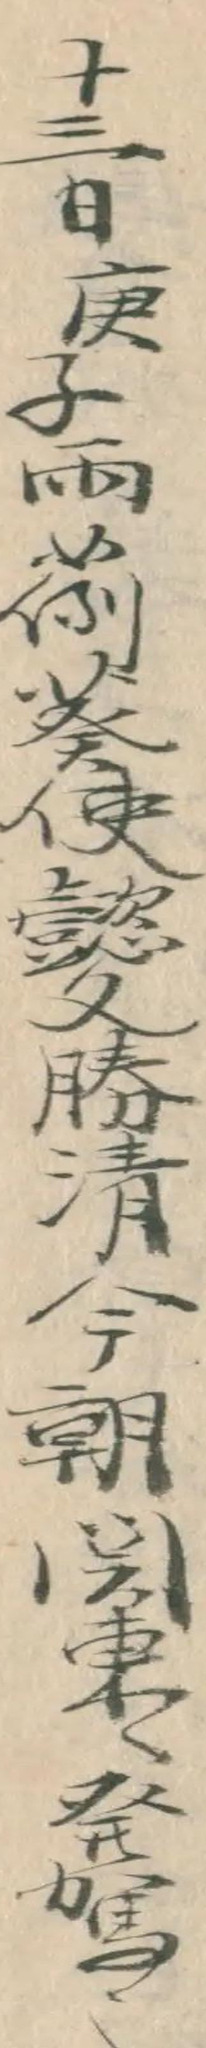十三日庚子雨如例葵使懿久勝清今朝関東へ発駕也
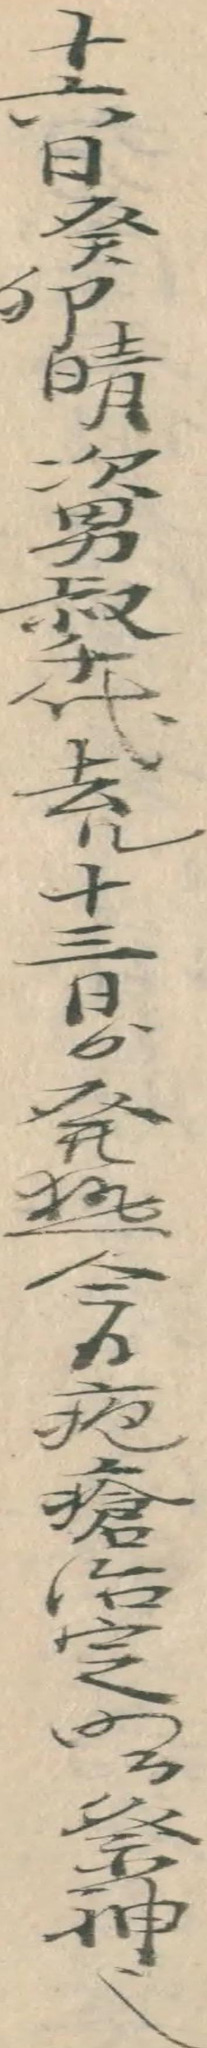十六日癸申晴次男叔千代去ル十三日ゟ発熱今日疱瘡治定仍而祭神也
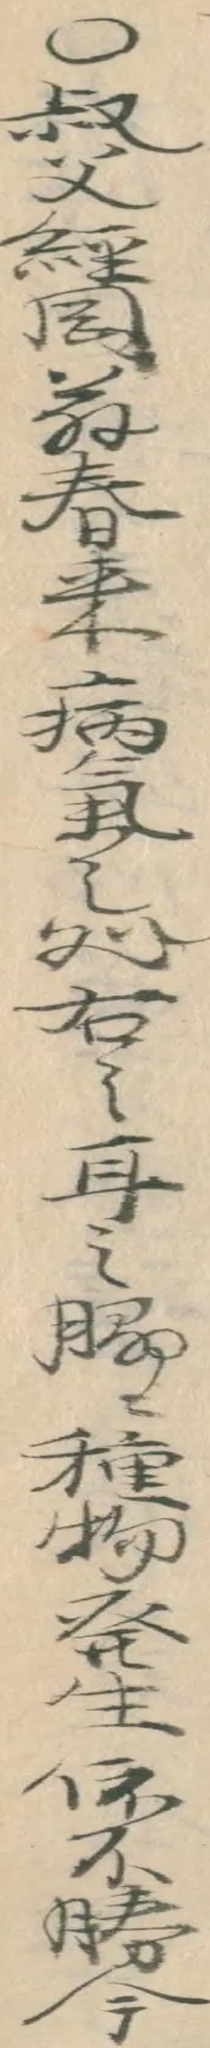○叔父経岡翁春来病氣之処右之耳之脇ニ種物発生依不勝今

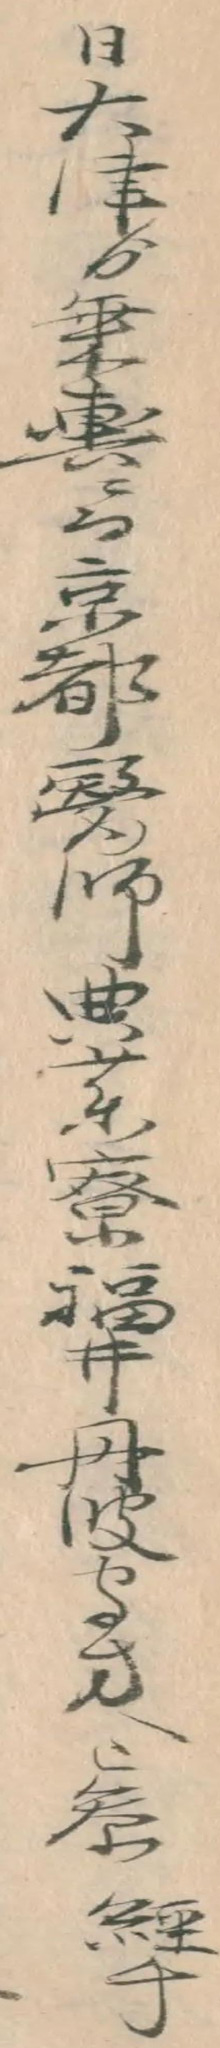日大津ゟ乗輿ニ而京都醫師典薬寮福井丹波守方へ被参経千
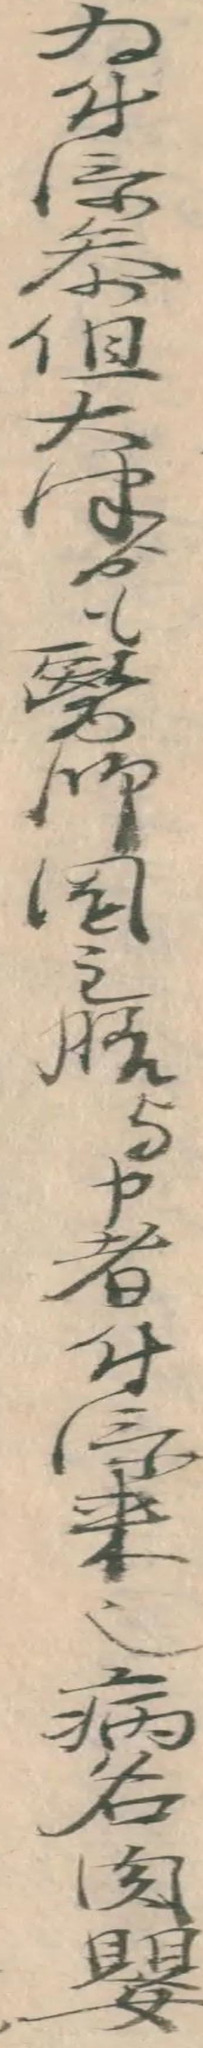為付添参但大津ゟも醫師岡主膳与申者付添来也病名肉嬰
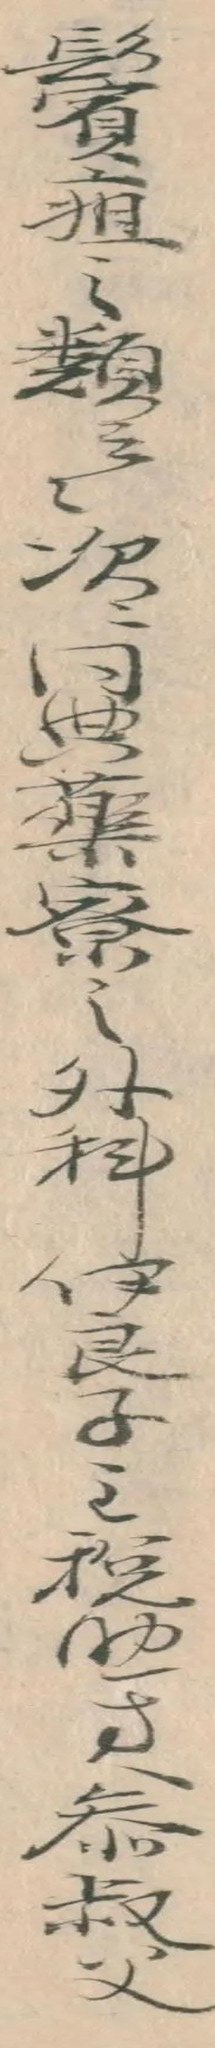鬢疽之類云々次ニ同典薬寮之外科伊良子主税助方へ参叔父
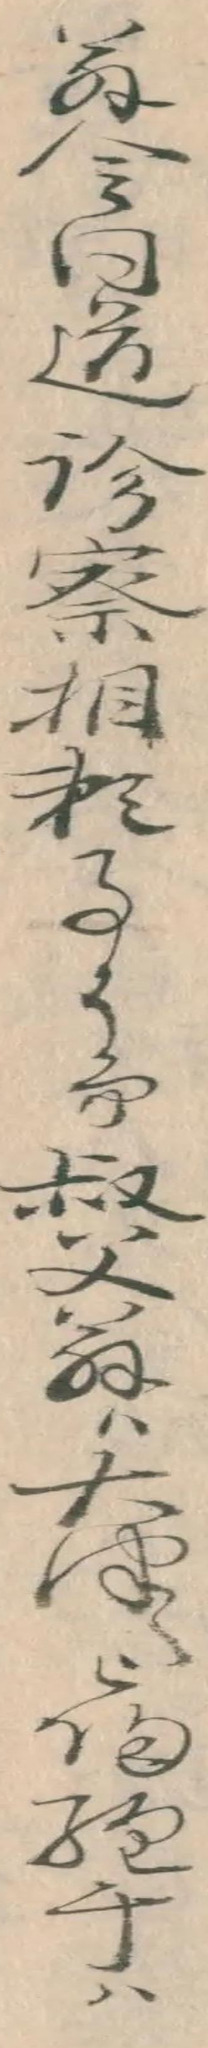翁令同道診察相頼事了而叔父翁ハ大津へ被帰経千ハ
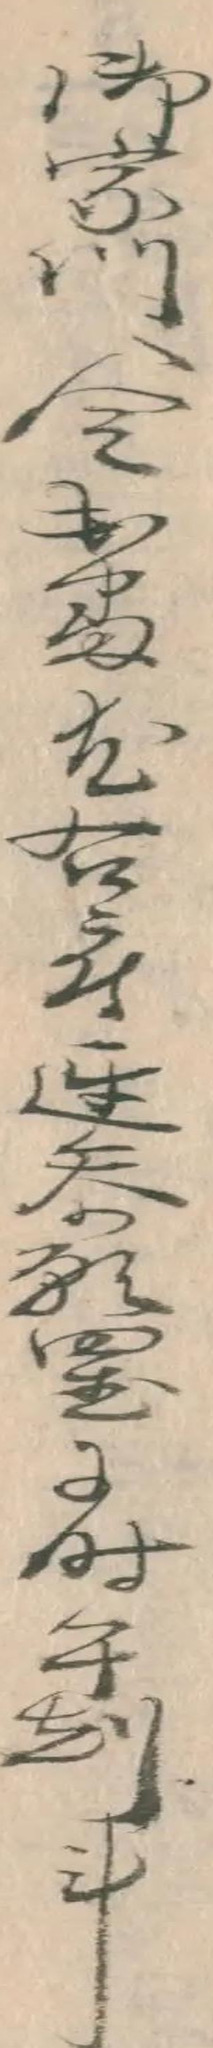御家門へ令出番尤右ニ付遅参願置于時午刻斗
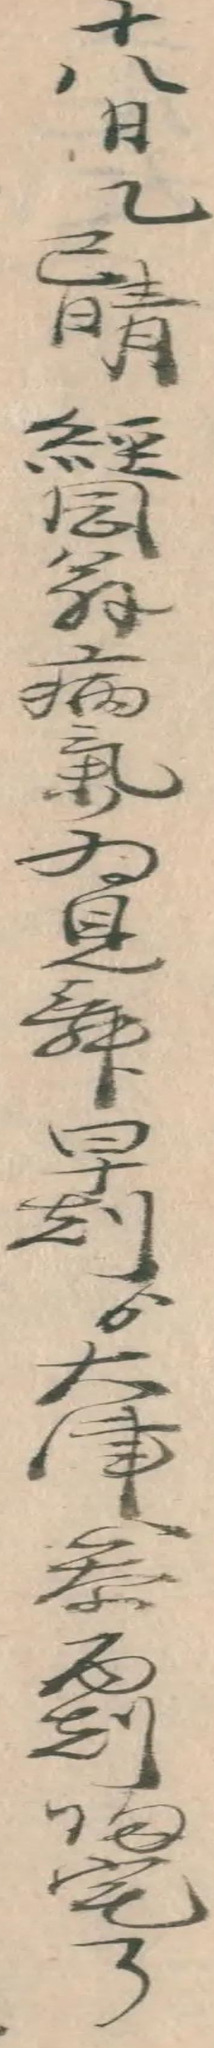十八日乙巳晴経同翁病気為見舞早刻ゟ大津参酉刻帰宅了
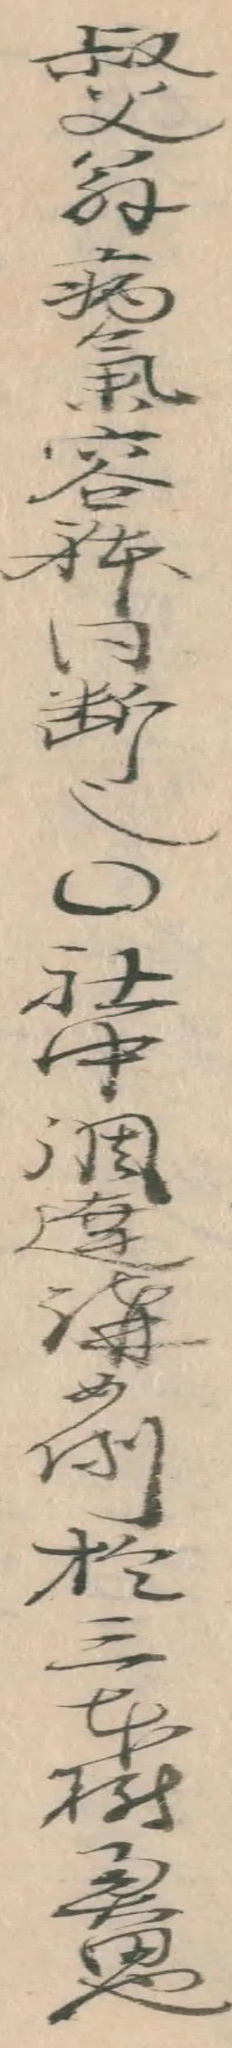叔父翁病気容躰同断也○社中調達講如例於三本樹邊田也
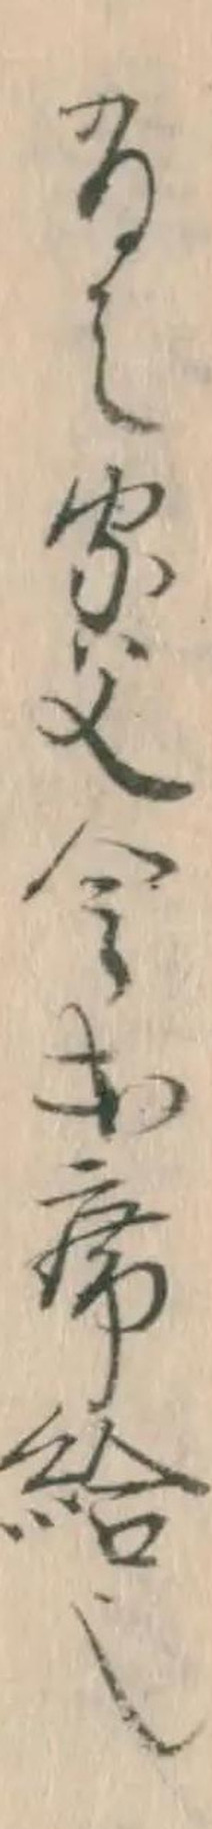有之家父令出席給也
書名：賀茂社記録. 第65冊
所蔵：国立国会図書館 National Diet Library, JAPAN
